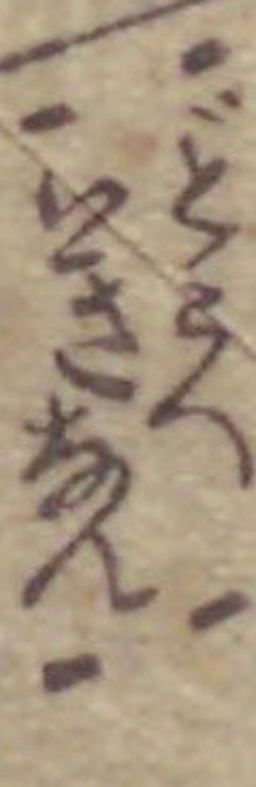いきなん
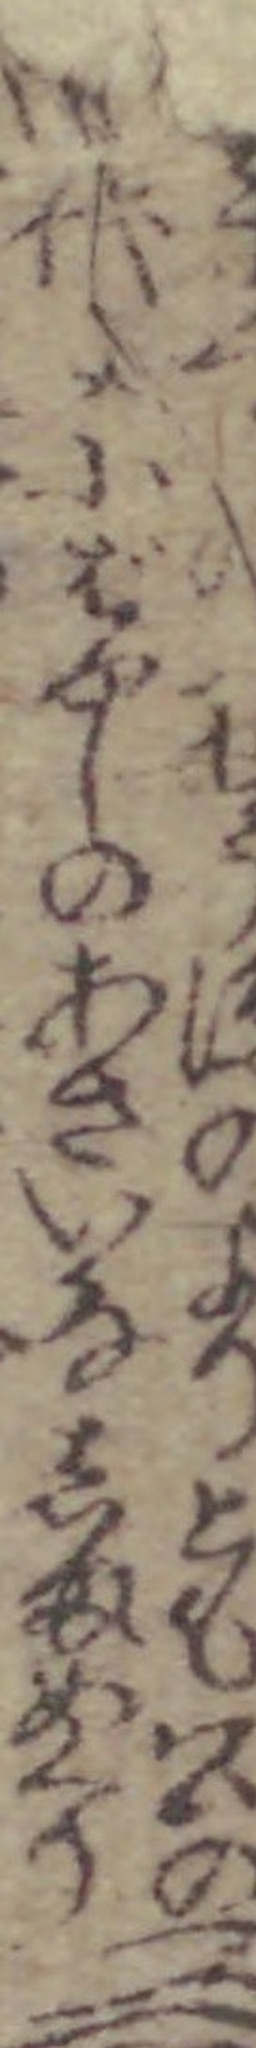御代に小ばやしのあさいなしまめくり
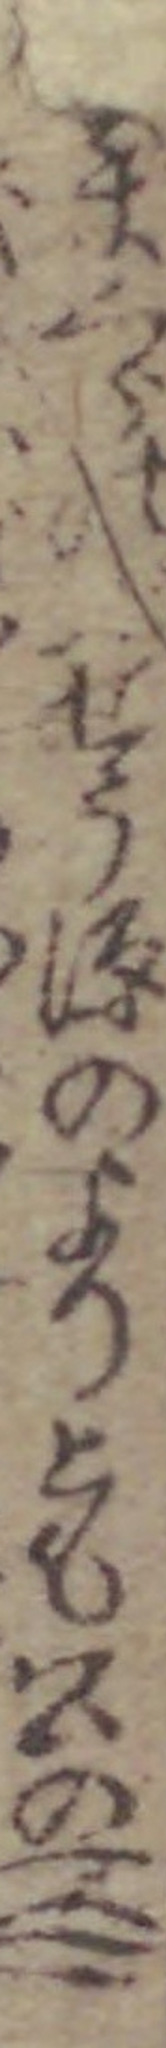かまくらのぶせう源のよりとも公の
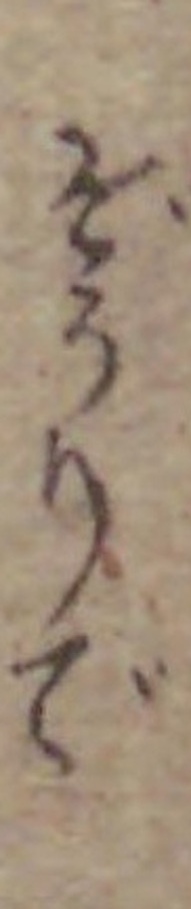ぞうりで
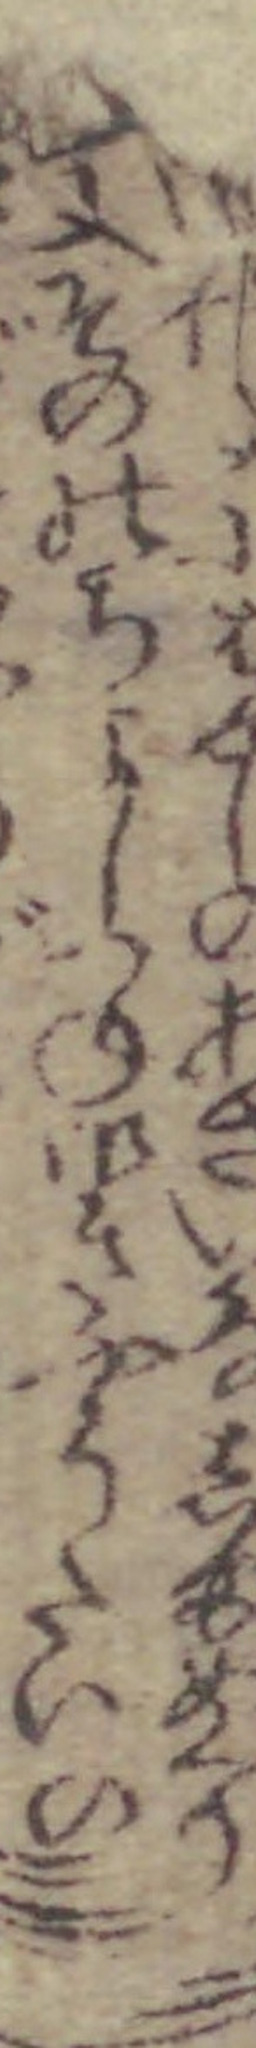又そののちよしつね御きやうたいの
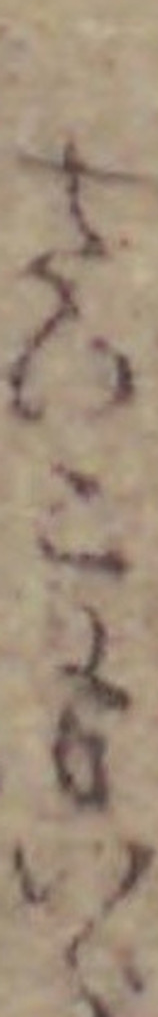たいこもいら
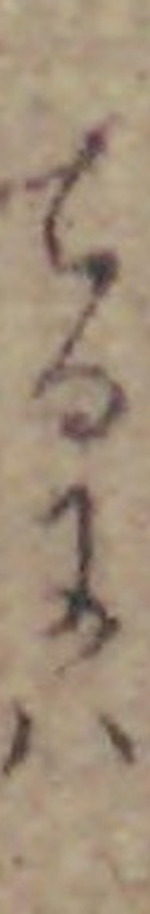てるには
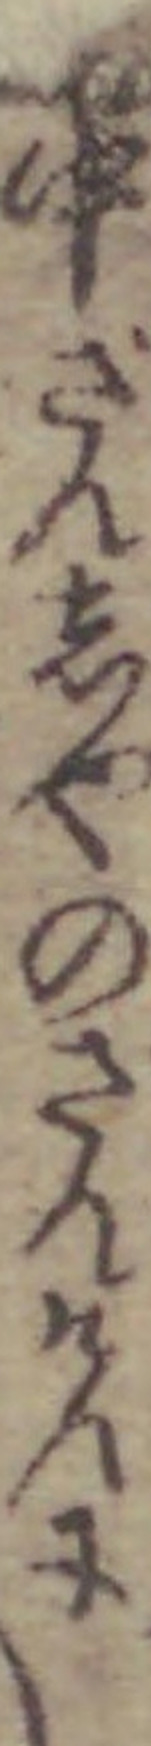中ざんしやのざんけんに
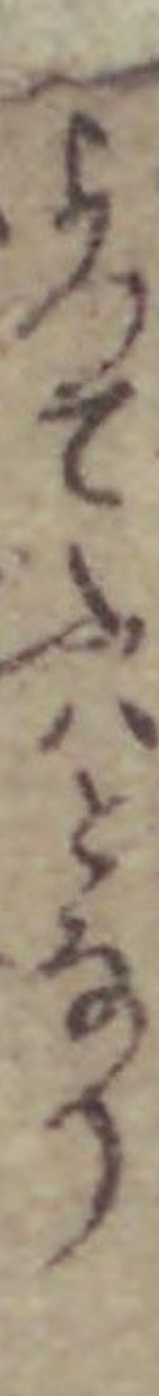よつてふはとなり
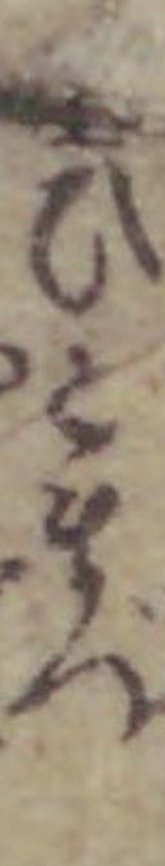ひとまづ
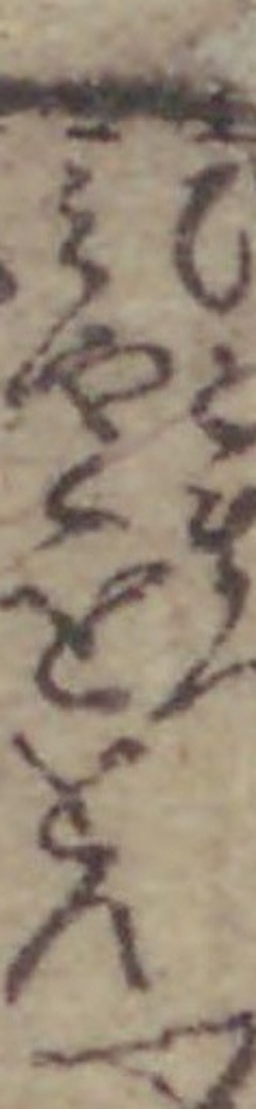みやこををん
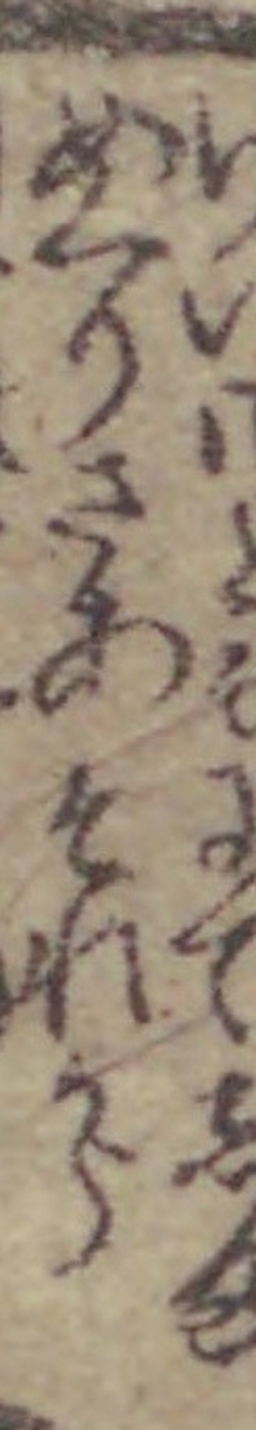めくりさあそれから
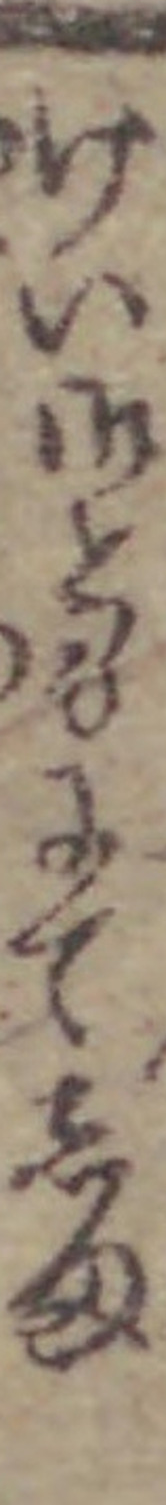けい御ともにてしま
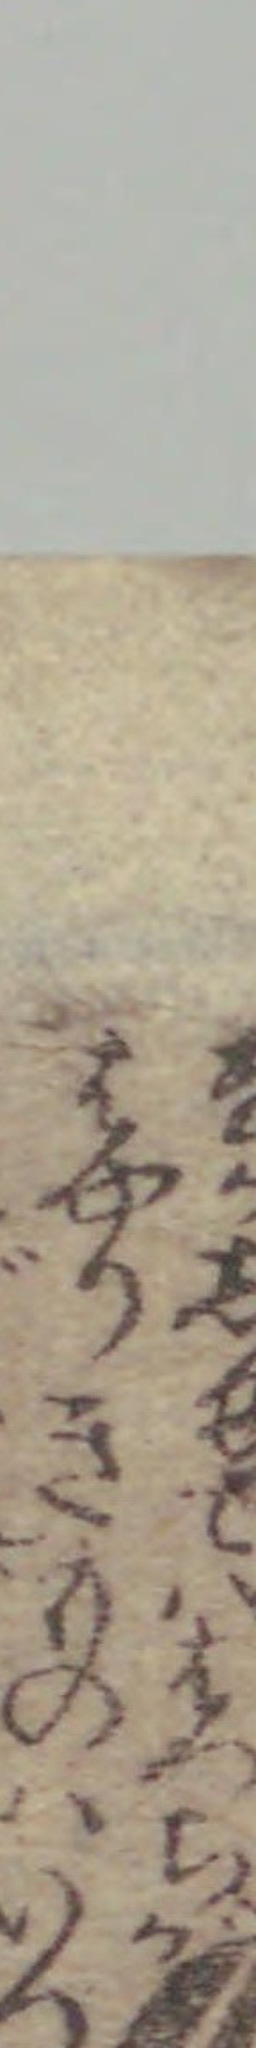はやりきものはいつ
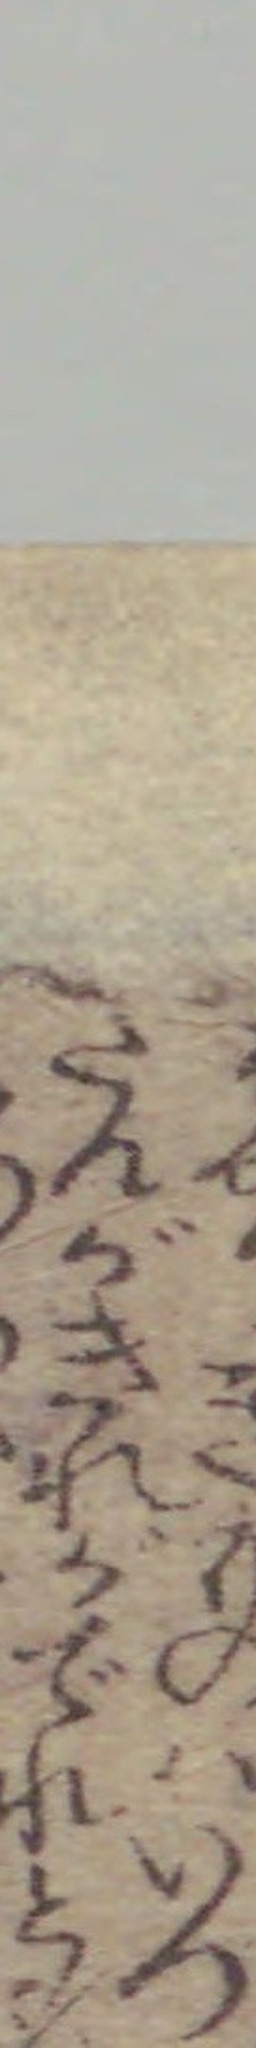たんがきれがでれとも

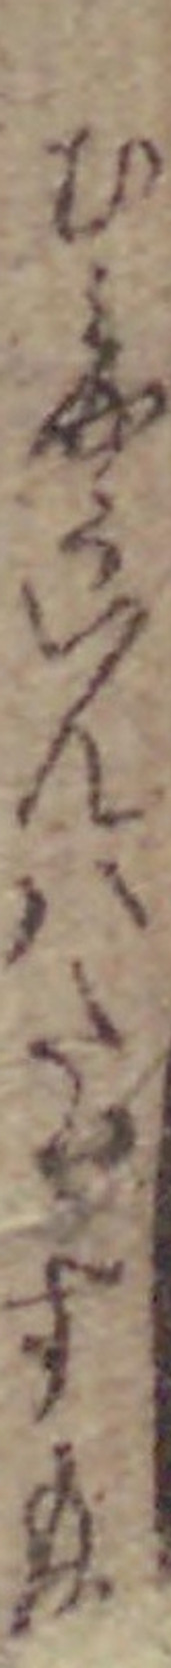むみやういんはたやすも
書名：近頃嶋めぐり 3巻
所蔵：国立国会図書館 National Diet Library, JAPAN
